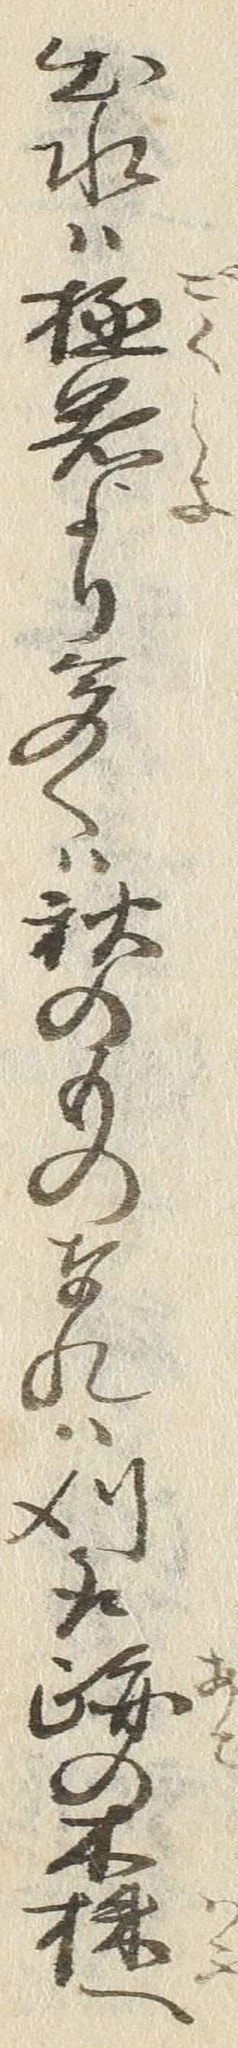出水は極暑より多くは秋のものなれは刈取跡の木株へ
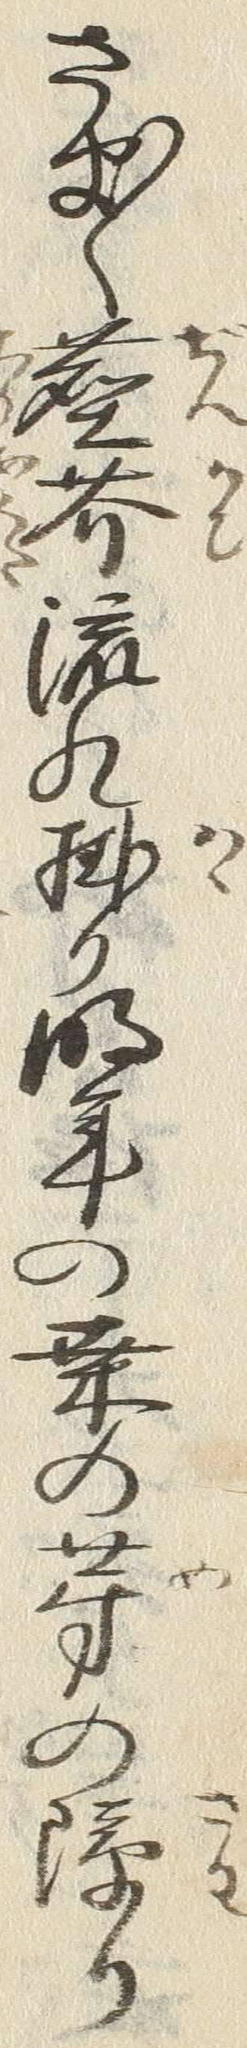さま〳〵塵芥流れ掛り明年の桑の芽の障り
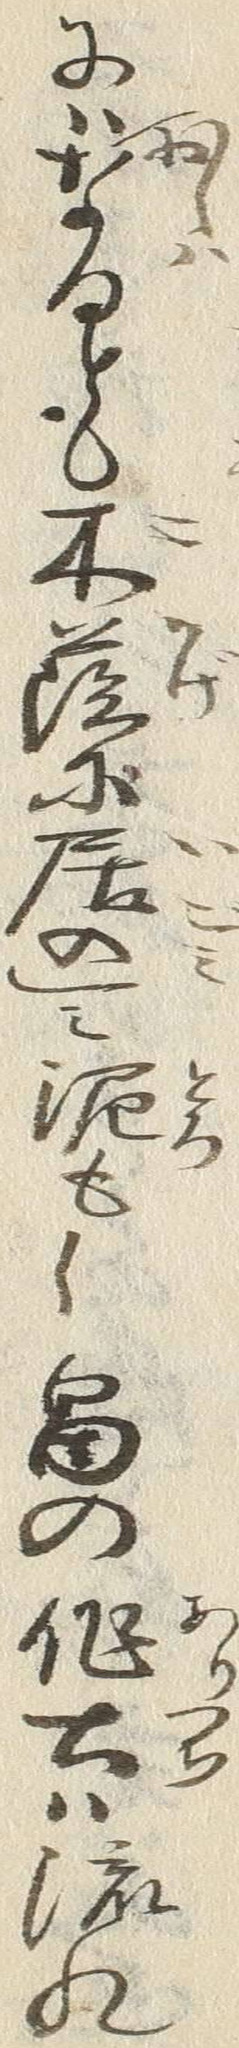尓は少しはなるとも木蔭尓居込み泥もし畠の作土は流れ
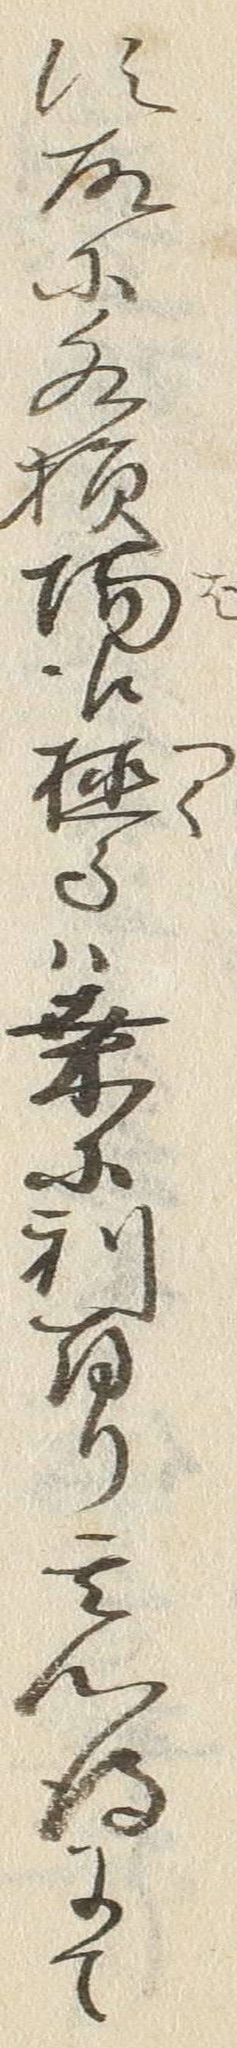須故尓水損場江植るは桑尓利有り其心得尓て
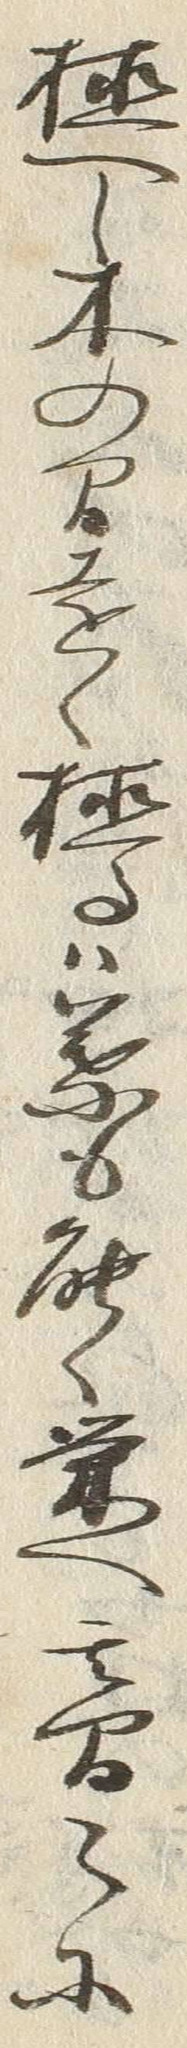植へし木の間遠く植るは葉も能く栄へ其間々尓
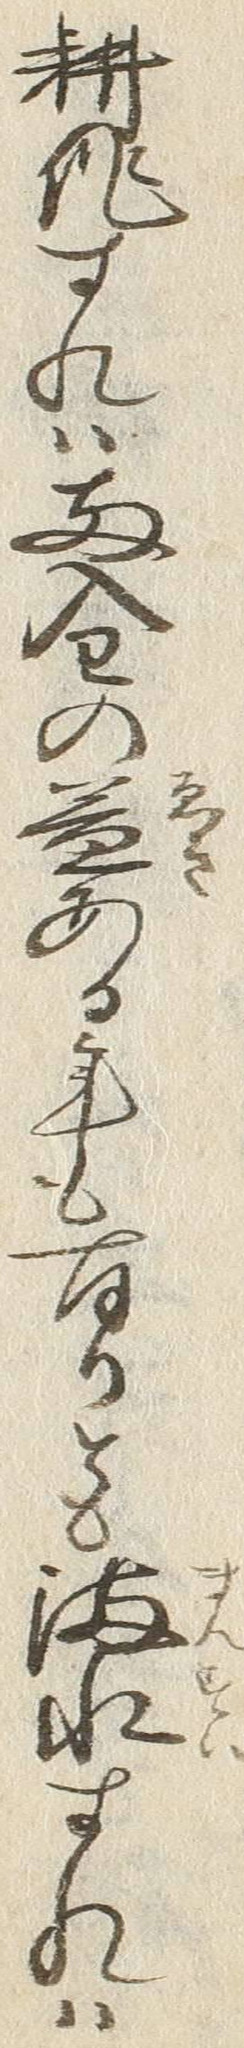耕作すれは両全の益ある年も有りとも満水すれは
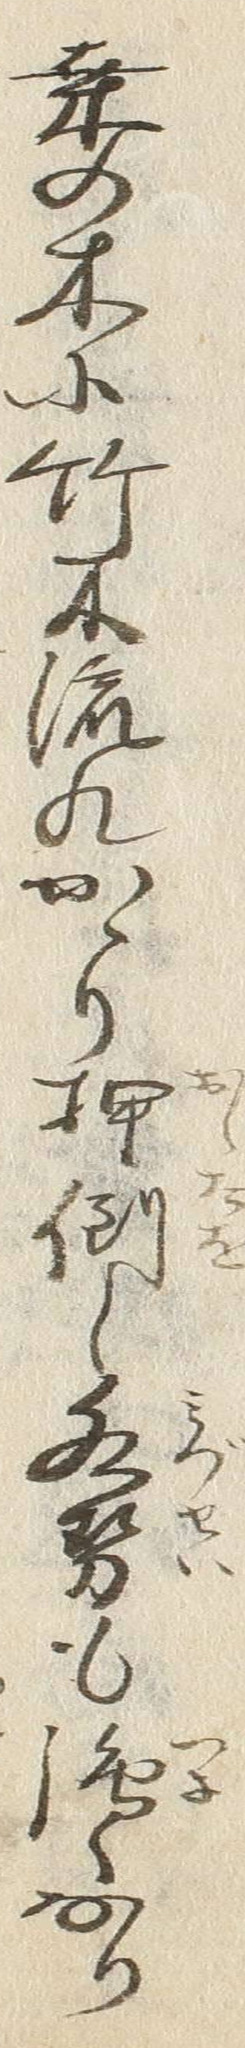桑の木尓竹木流れかゝり押倒し水勢も強くなり
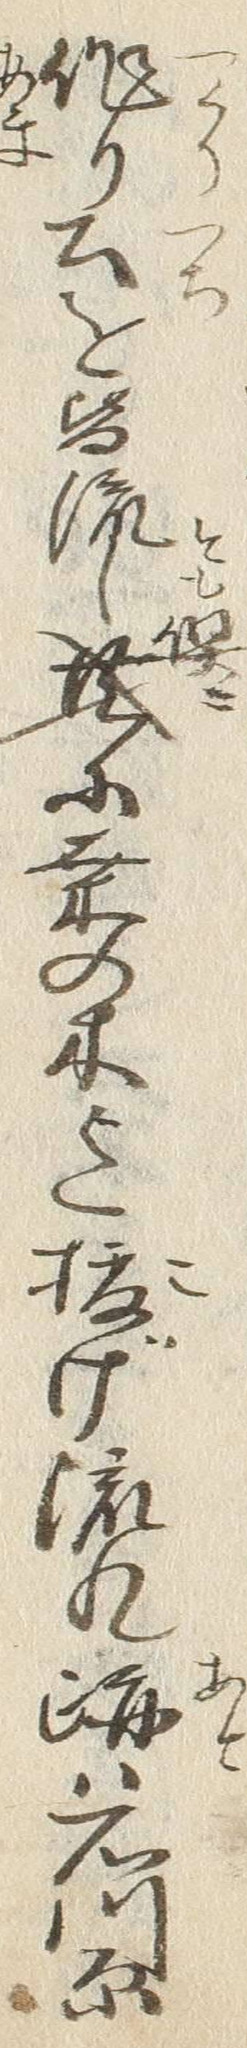作り土を皆流し倶尓桑の木迄抜げ流れ跡は石川原
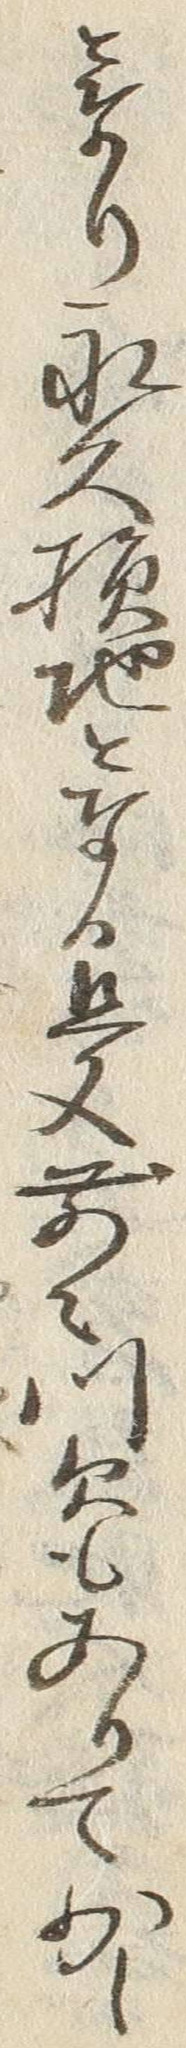となり永久損地となる且又前々川欠もありて少し
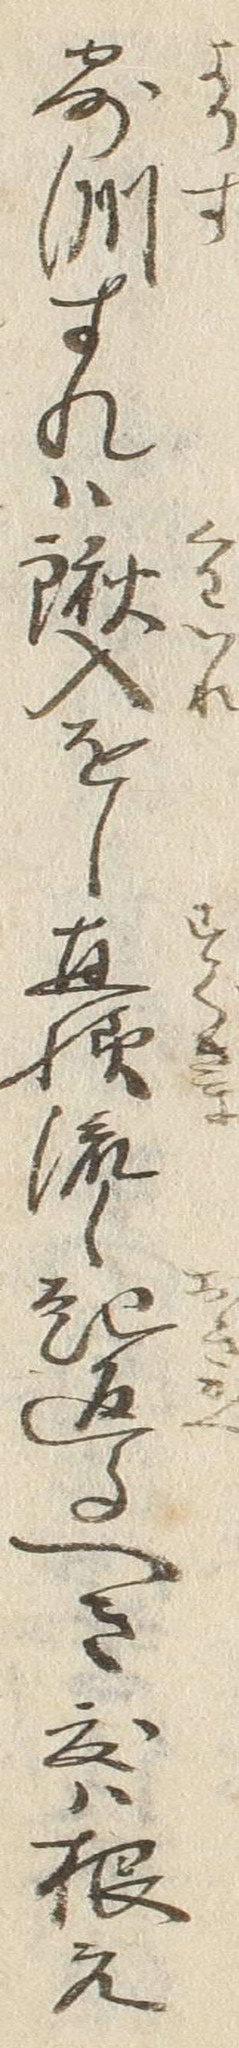寄洲すれは鍬入をし直様流し起返るへき度は根元
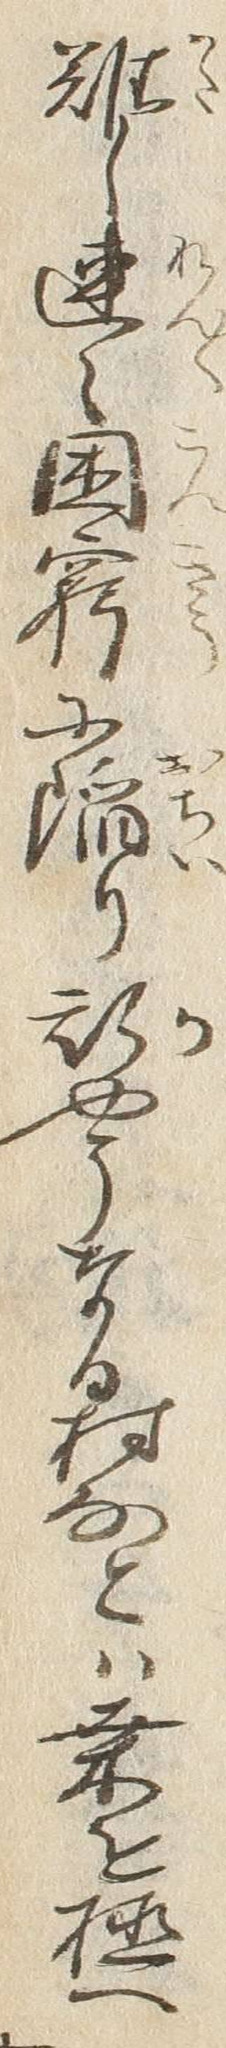難し連々困窮尓陥り斯やうなる村なとは桑を植へ

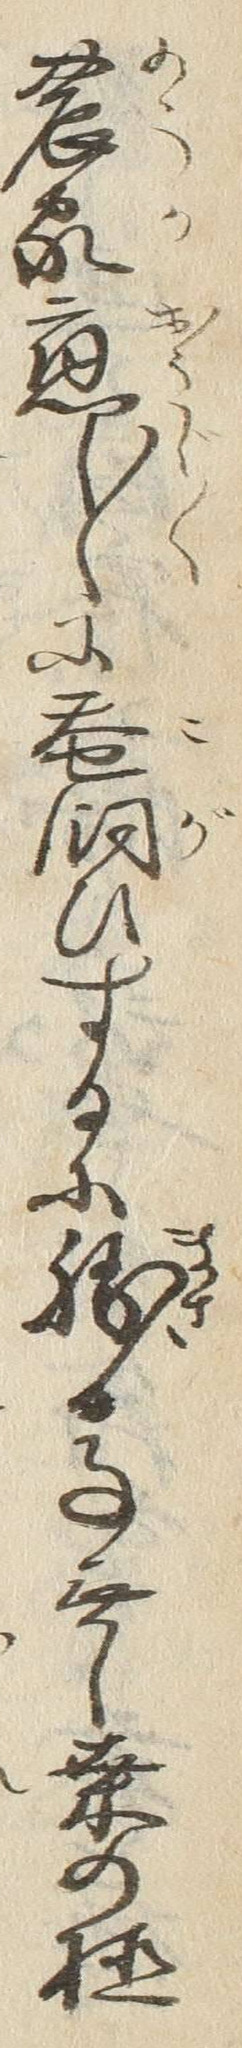農家應じ〳〵尓蚕飼ひする尓勝る事無し桑の植
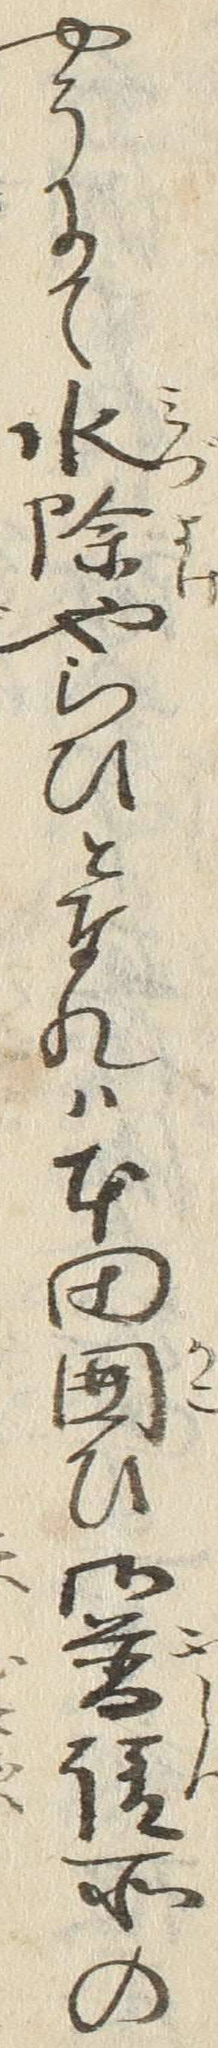やう尓て水除やらひとなれは本田囲ひ御普請所の
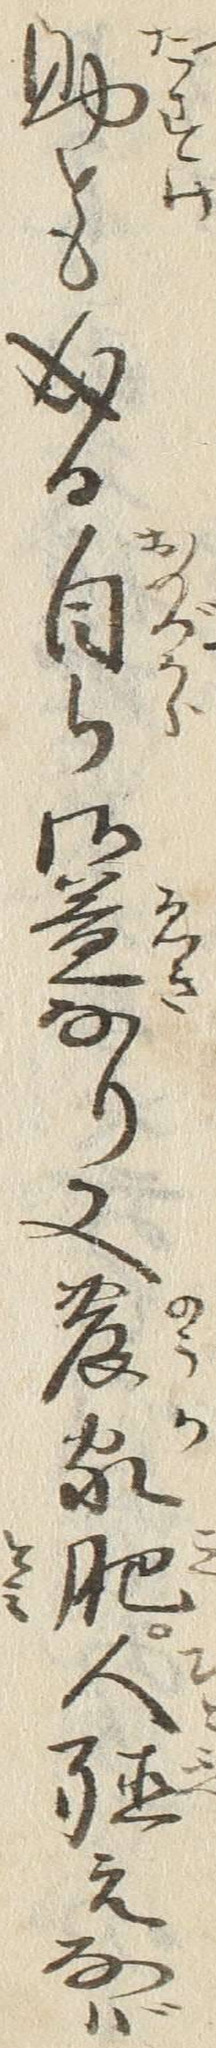助とも成る自ら御益なり又農家肥。人殖えなば
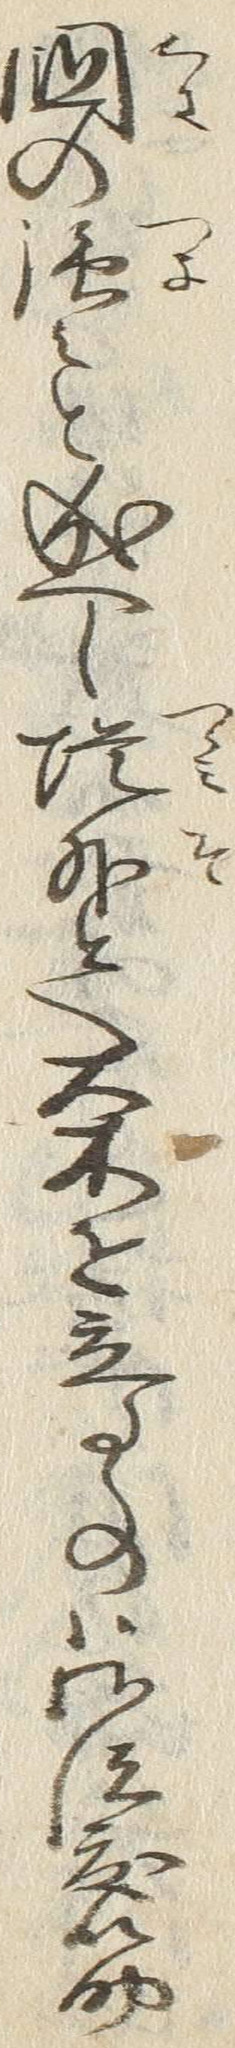國の強みと成へし堤外とへ大木を立る事は御法度筋
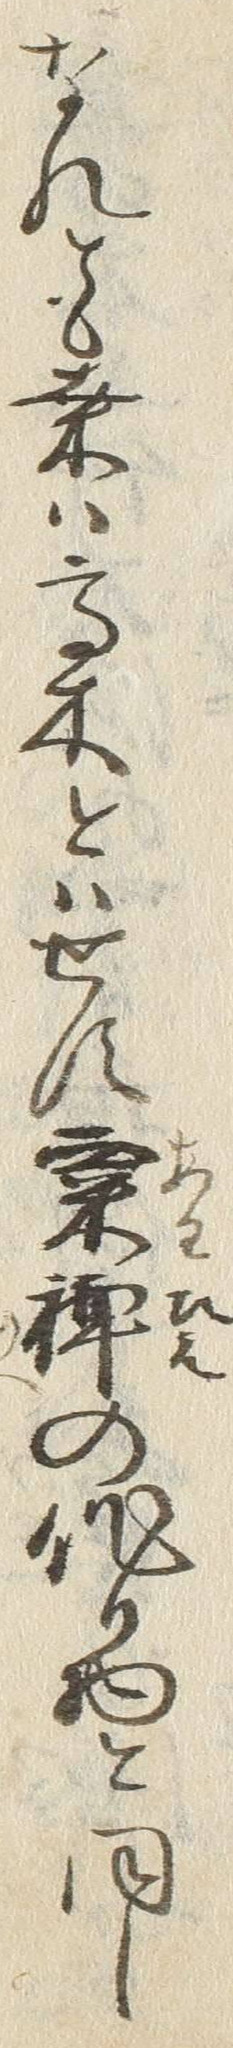なれとも桑は高木とはせ須粟稗の作り物と同し
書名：養蠶實驗録後編
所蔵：東京大学農学生命科学図書館 国文学研究資料館
